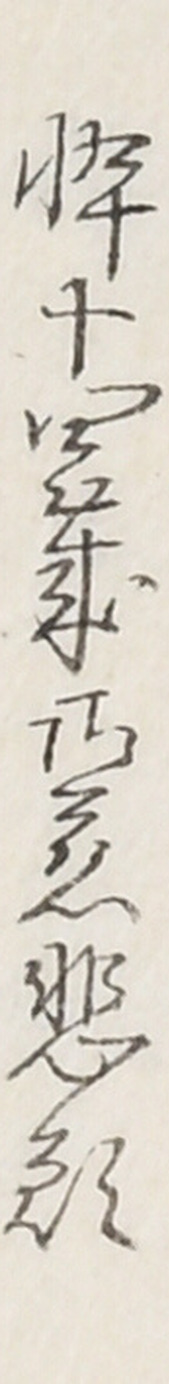忰十四歳御慈悲願
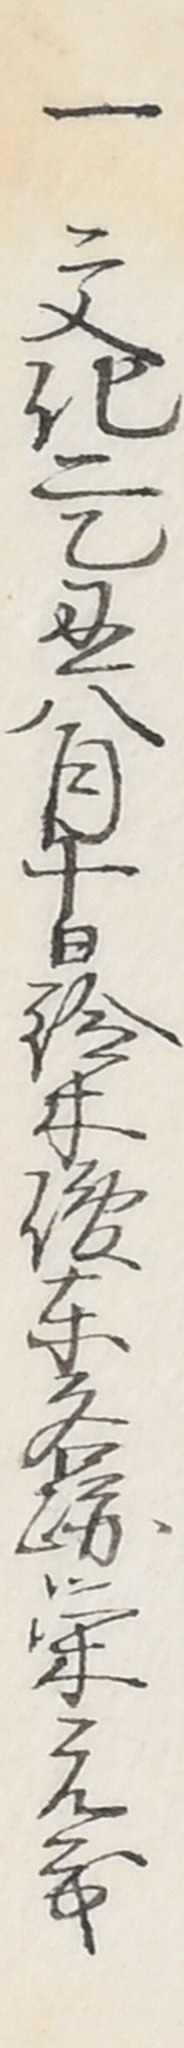一文化二乙丑八月十日鈴木俊東名跡栄元義
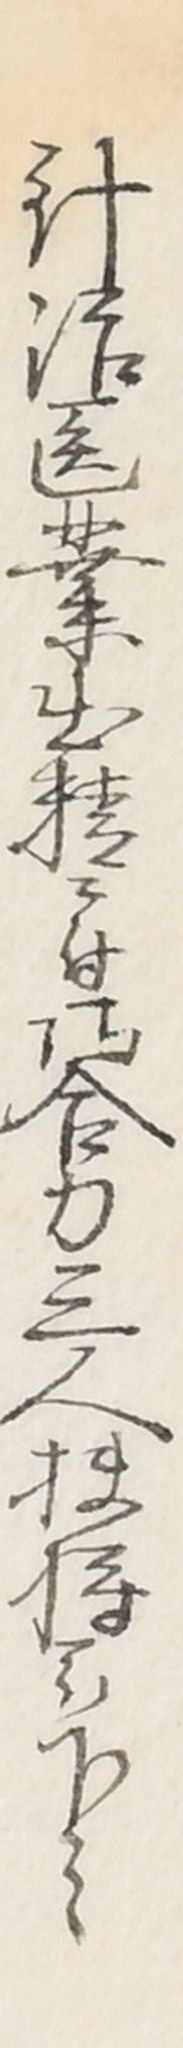針治医業出精ニ付御合力三人扶持被下之
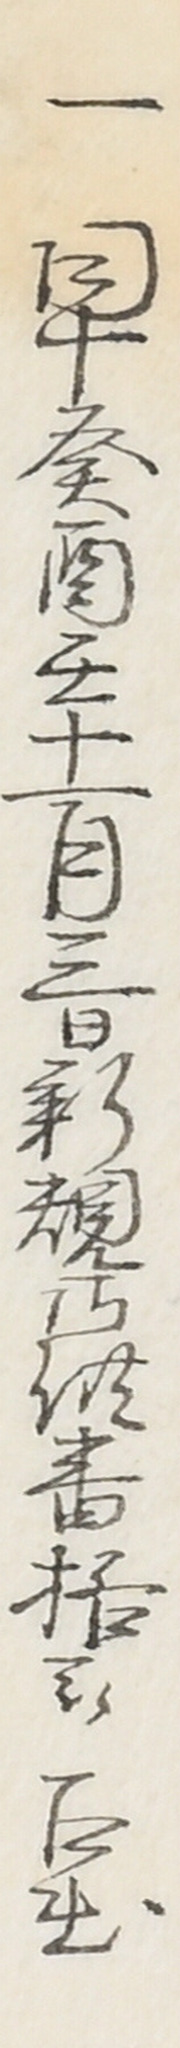一同十癸酉閏十一月三日新規御供番格被召出
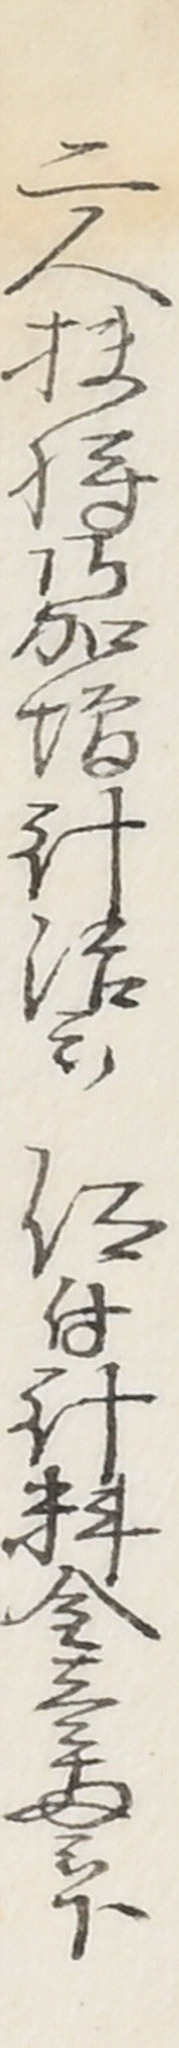二人扶持御加増針治被仰付針料金壱両被下
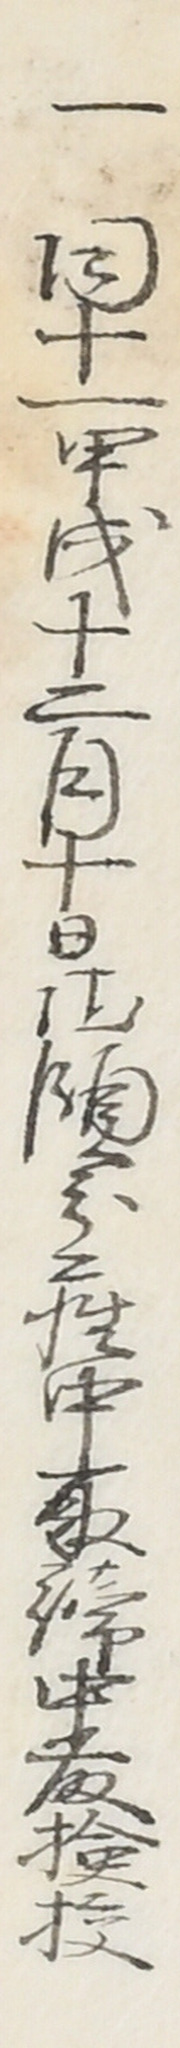一同十一甲戌十二月十日御領分座中取締中藤検校
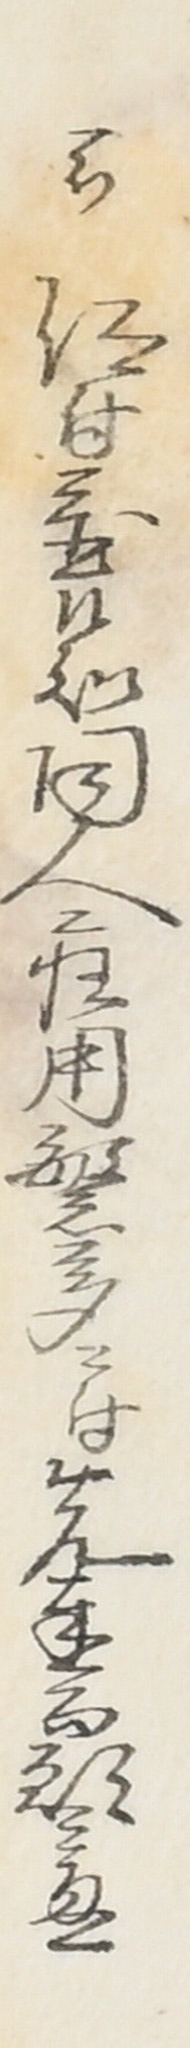被仰付置候処同人座用繁多ニ付先達而願之通
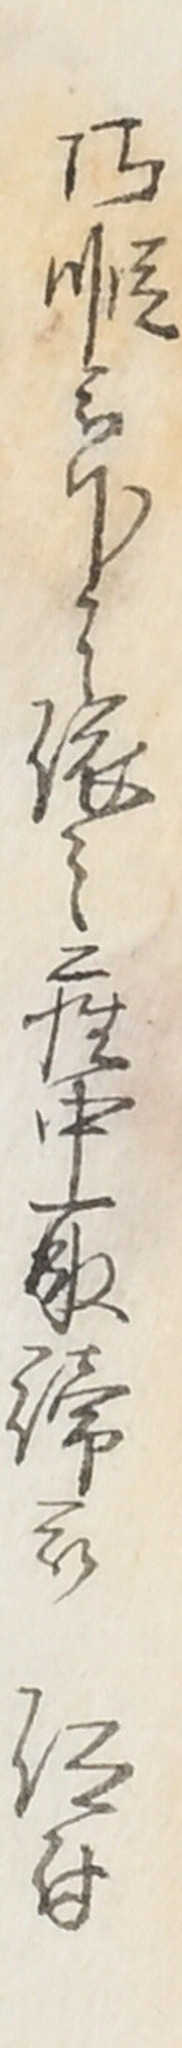御暇被下之依之座中取締被仰付
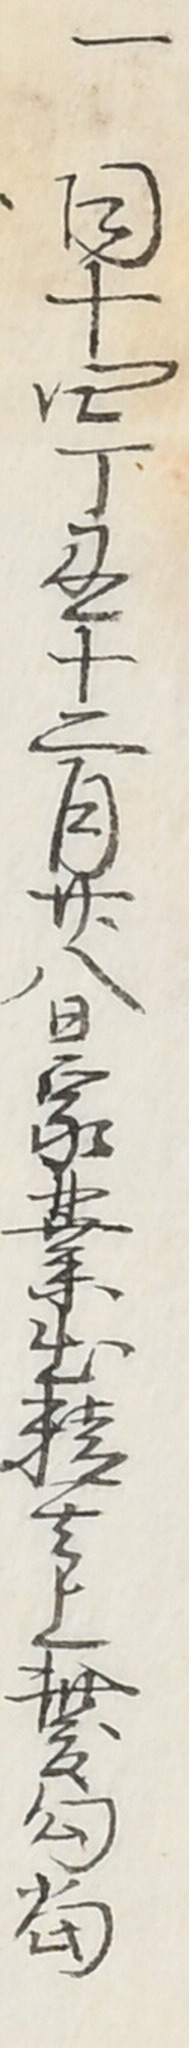一同十四丁丑十二月廿八日家業出精其上此度勾当
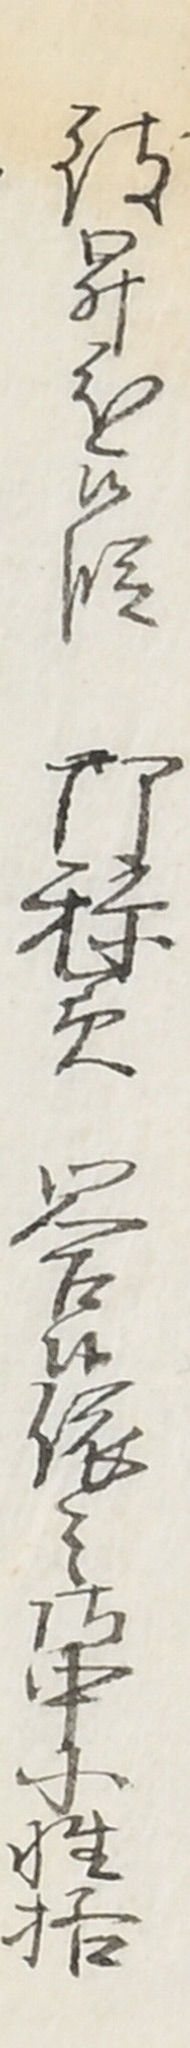致昇進候段御称美思召候依之御中小性格
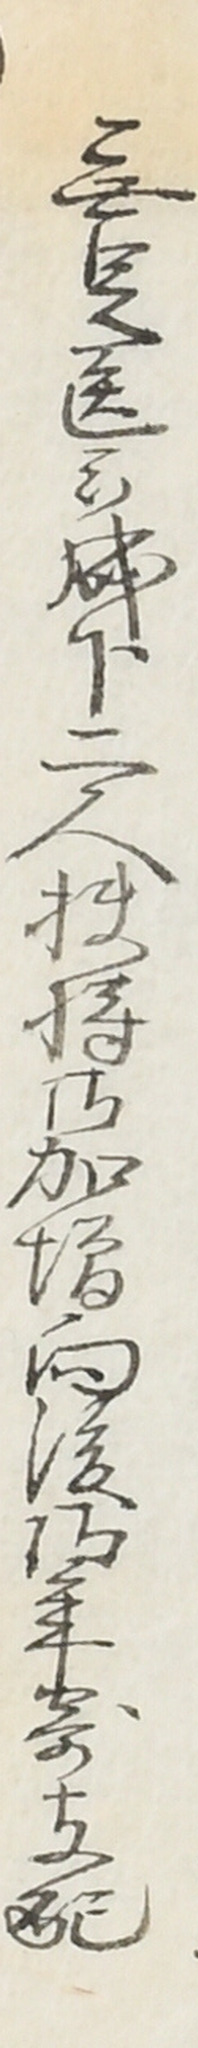無足医被成下二人扶持御加増向後御年寄支配
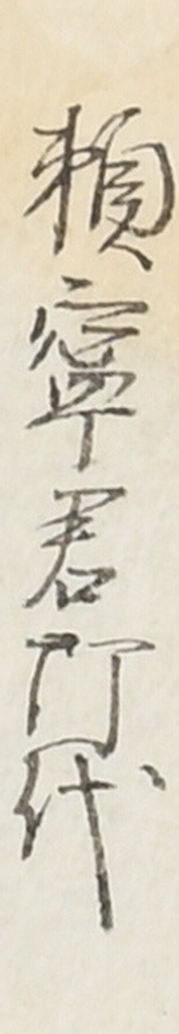頼寧君御代
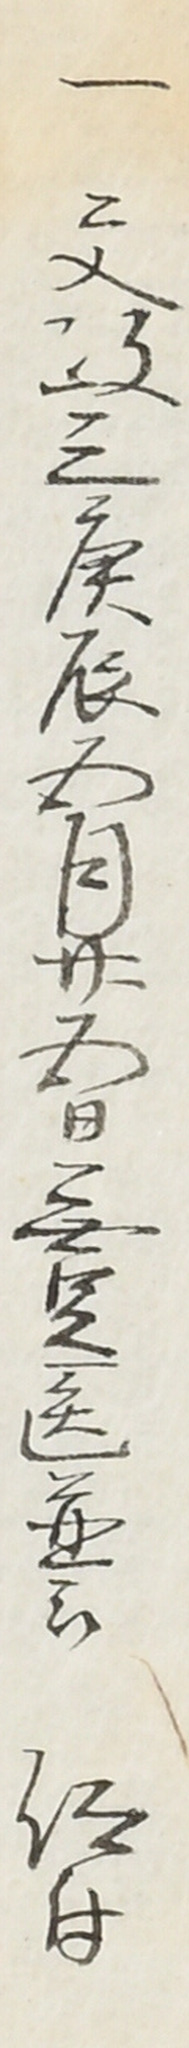一文政三庚辰五月廿五日無足医並被仰付
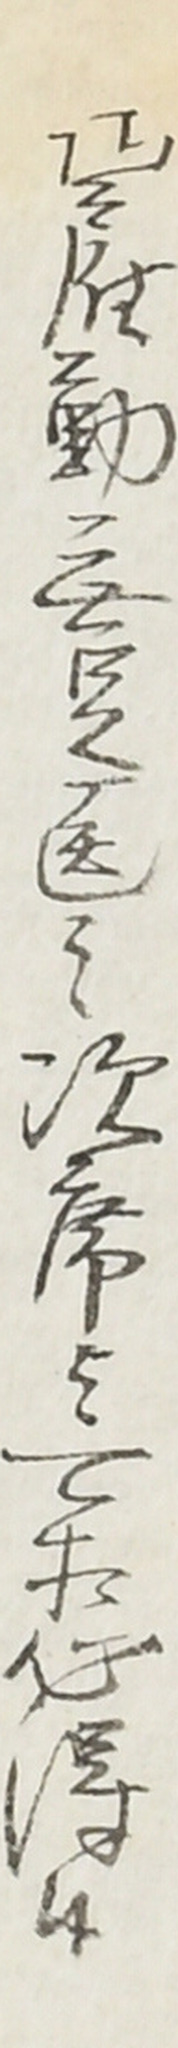御雇勤無足医之次席与可相心得候
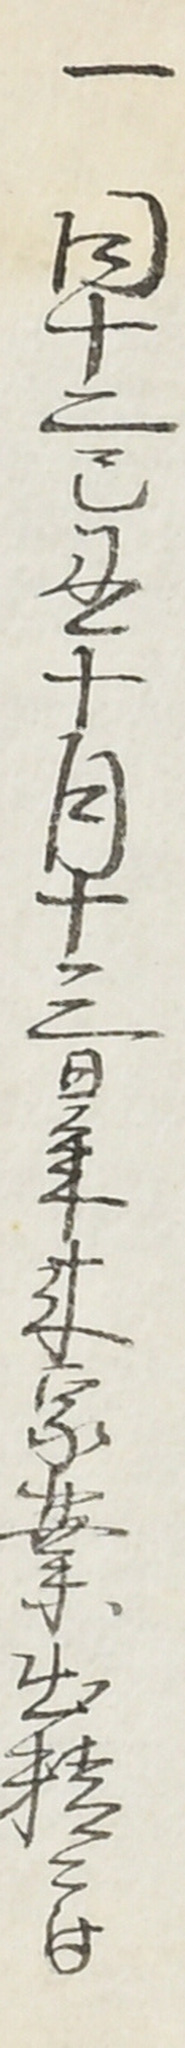一同十二己丑十月十三日年来家業出精ニ付
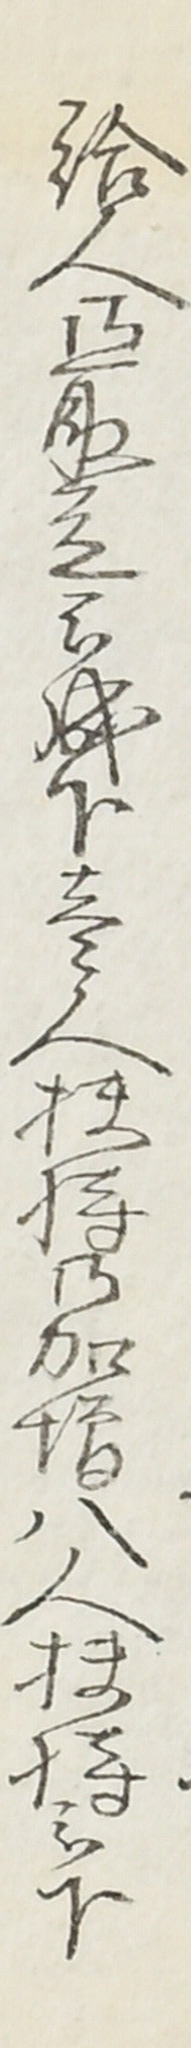給人御取立被成下壱人扶持御加増八人扶持被下
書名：給人諸士勤仕録（七）
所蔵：伊那市立高遠町図書館・合同会社AMANE
